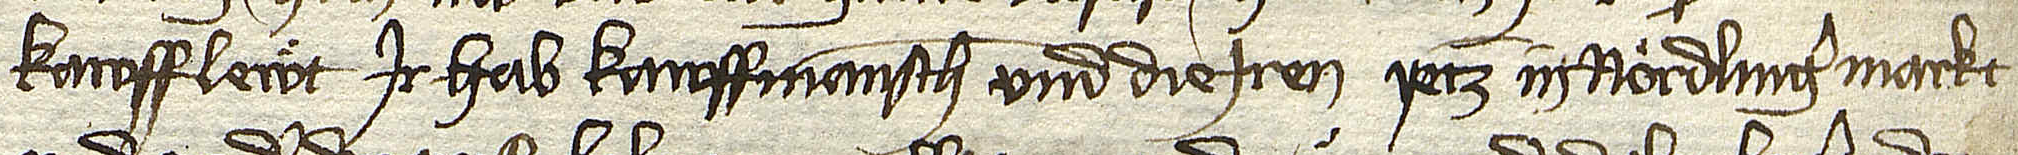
kawfflewt Ir hab kawffmanſch* vnd die Iren yecʒ* in Nördling* markt
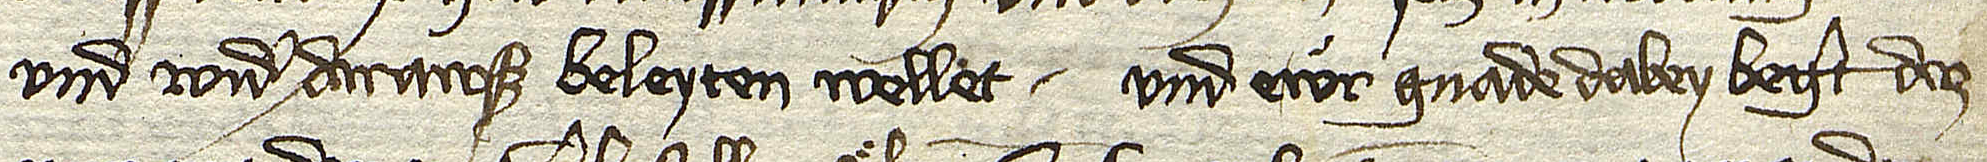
vnd wid* darawſʒ beleyten wellet / vnd ewr gnade dabey beg*t daʒ
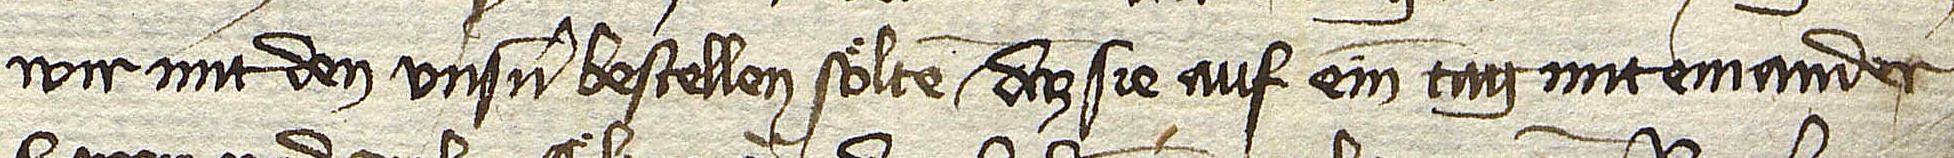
wir mit den vnſ*n beſtellen ſölte* / daʒ ſie auf ein* tag mit einander
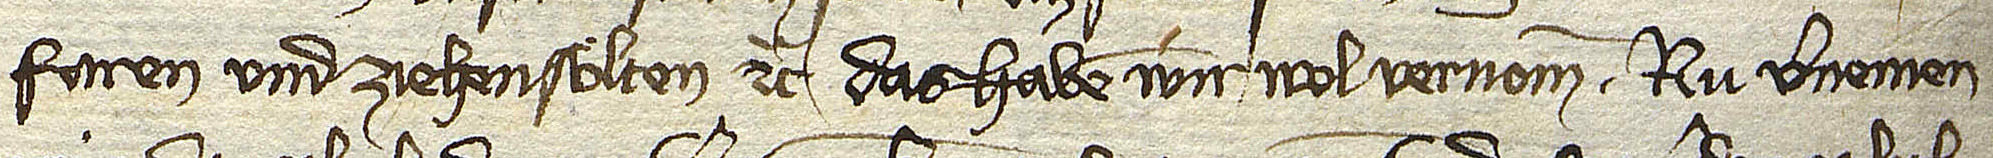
faren vnd ʒiehen ſölten ec* das habe* wir wol vernom* . Nu v*nemen
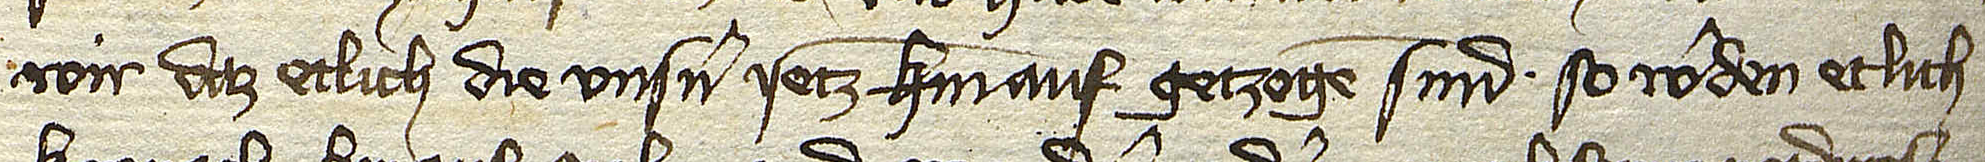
wir daʒ etlich die vnſ*n yecʒ* hinauf gecʒoge* ſind . ſo w*den etlich
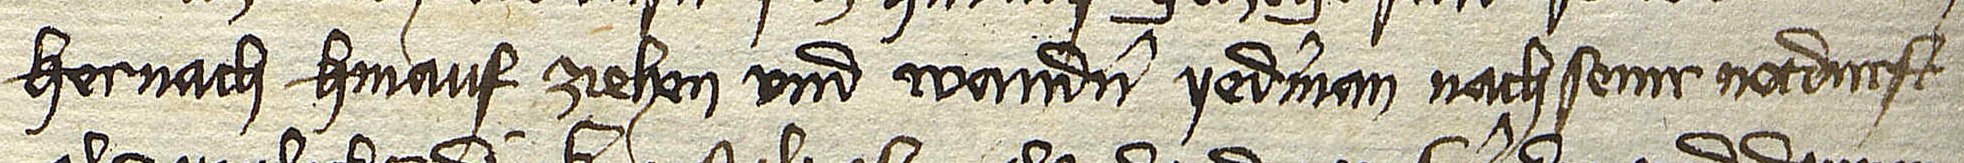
hernach hinauf ʒiehen vnd wand*n yed*man nach ſeinr notdurft
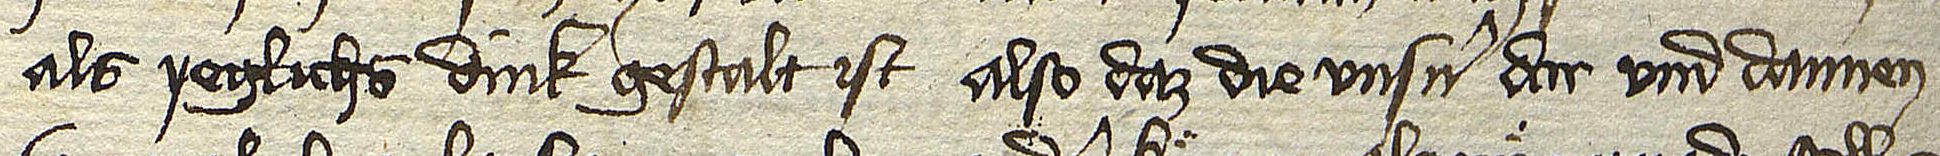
als yeglichs dink geſtalt iſt / Alſo daʒ die vnſ*n dar vnd dannen
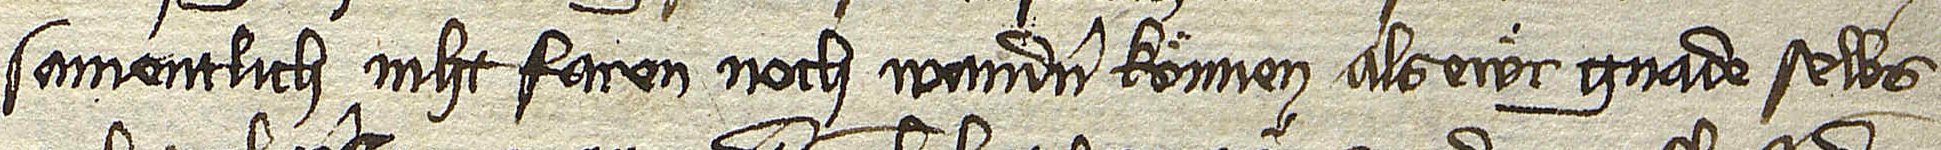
ſamentlich niht faren noch wand*n können / Als ewr gnade ſelbs
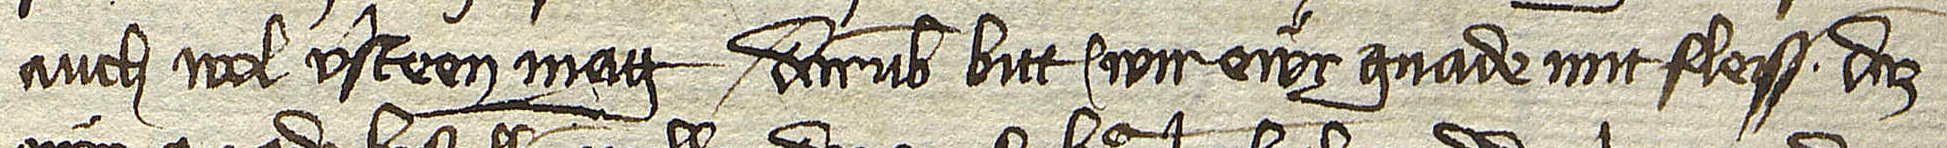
auch wol v*ſteen mag / Daru*b bitt* wir ewr gnade mit fleiſſ . daʒ
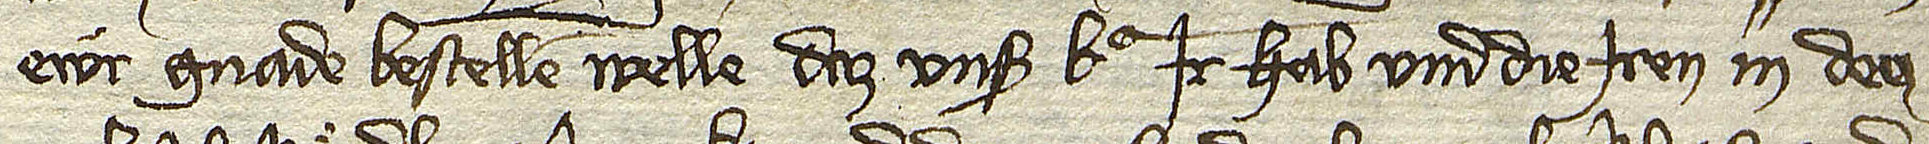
ewr gnade beſtelle* welle daʒ vnſ* b* Ir hab vnd die Iren in den
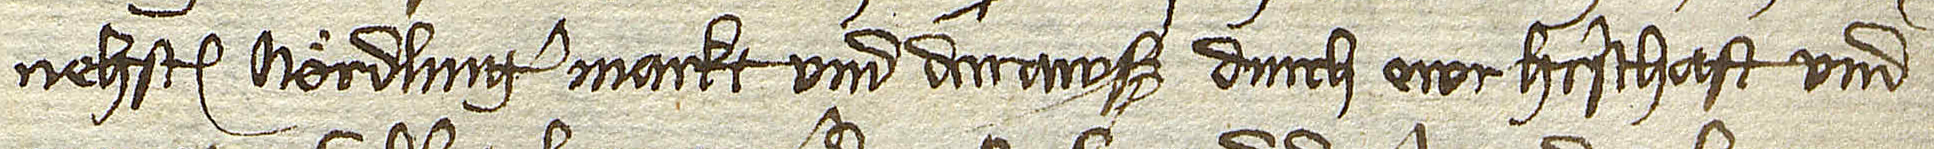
nehſt* Nördling* markt vnd darawſʒ durch ewr h*rſchaft vnd
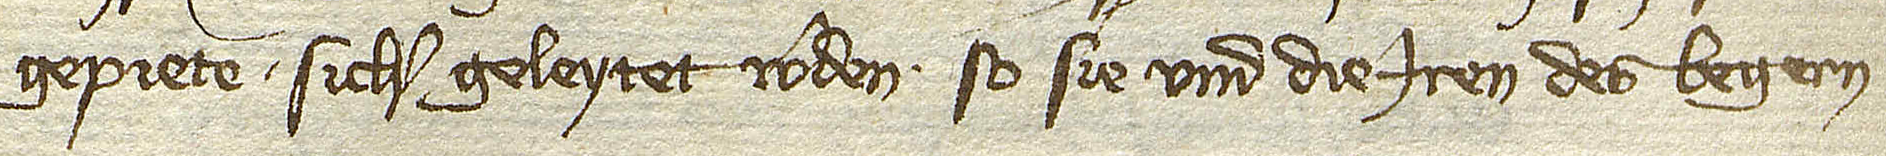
gepiete . ſich* geleytet w*den . ſo ſie vnd die Iren des begern
